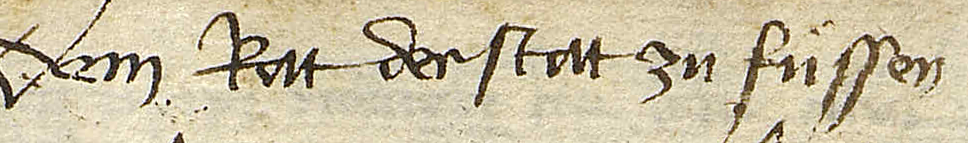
Dem Rat der ſtat ʒu füſſen
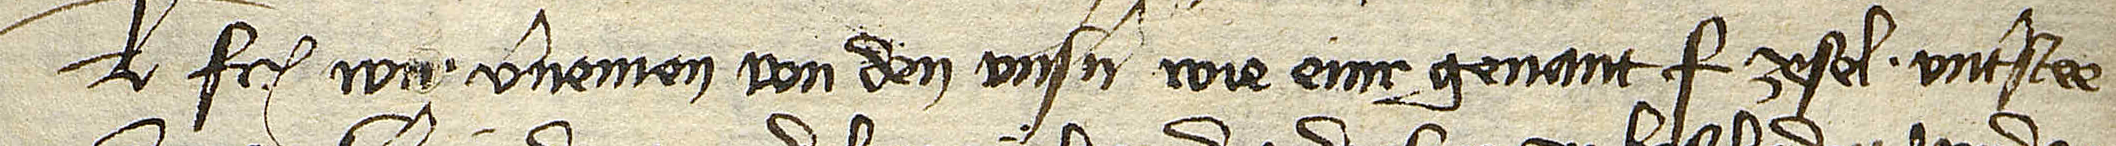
L* fr* wir v*nemen von den vnſn* wie einr genant F ʒefel . vnt*ſtee
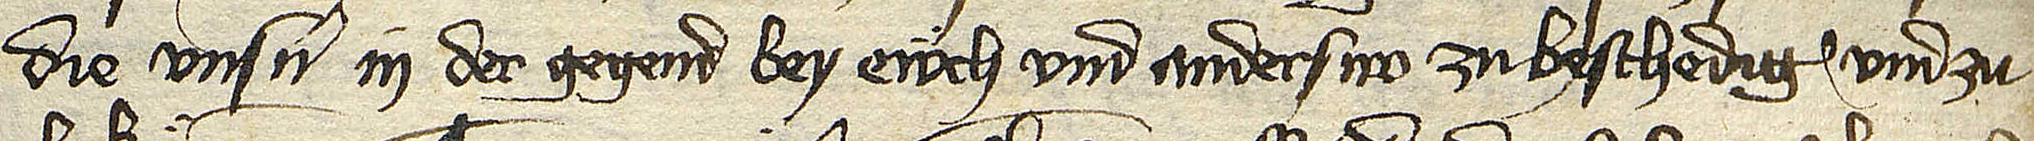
die vnſn* in der gegend bey eẅch vnd anderſwo ʒu beſchedig* vnd ʒu
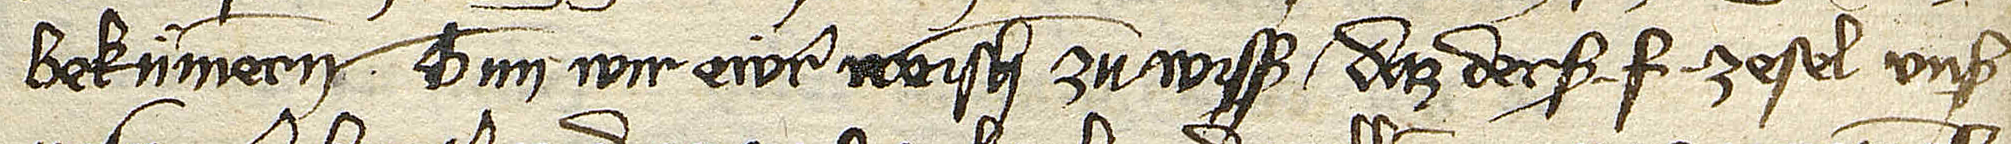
beküm*ern . Tun wir eẅr* weiſh* ʒu wiſſ* / Daʒ derſ*. F . ʒefel vnſ*
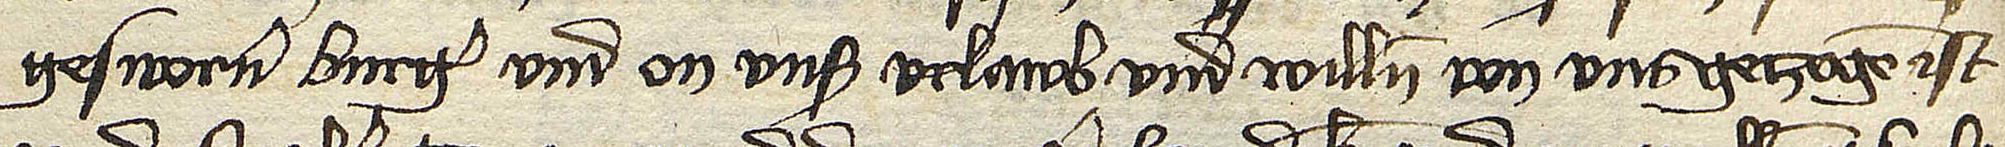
geſworn* burg* vnd on vnſ* vrlawb vnd willn* von vns gecʒoge* iſt
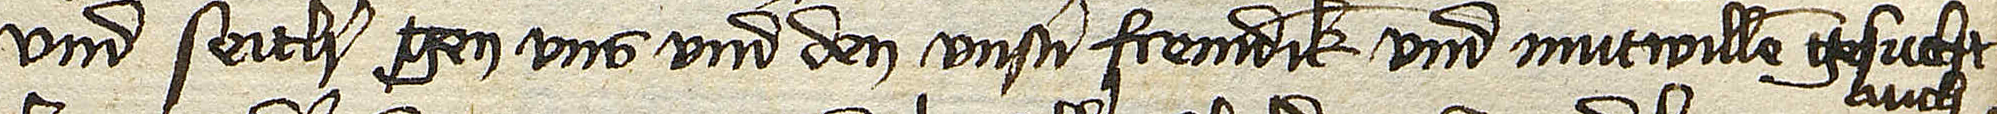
vnd ſeith* gen vns vnd den vnſn* fremdik* vnd mutwille* geſucht
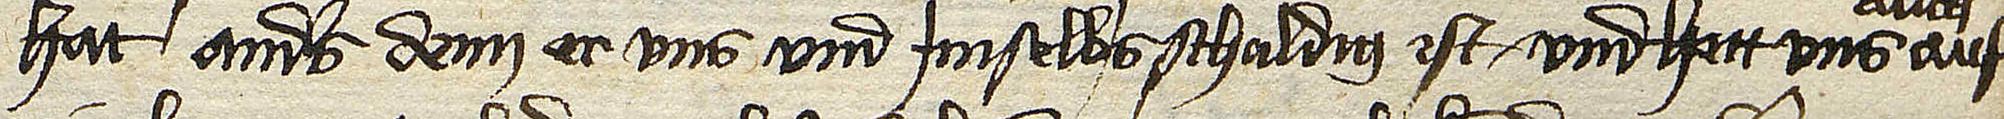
hat and*s denn er vns vnd Imſelbs ſchuldig iſt / vnd hett vns auf
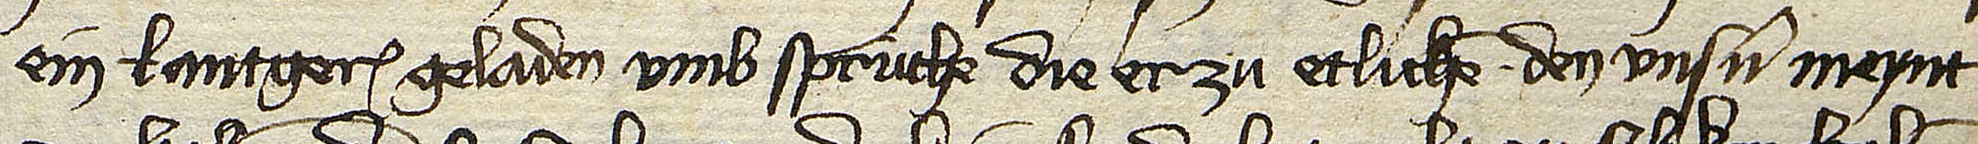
ein lantger* geladen vmb ſprüche die er ʒu etliche* . den vnſn* meynt
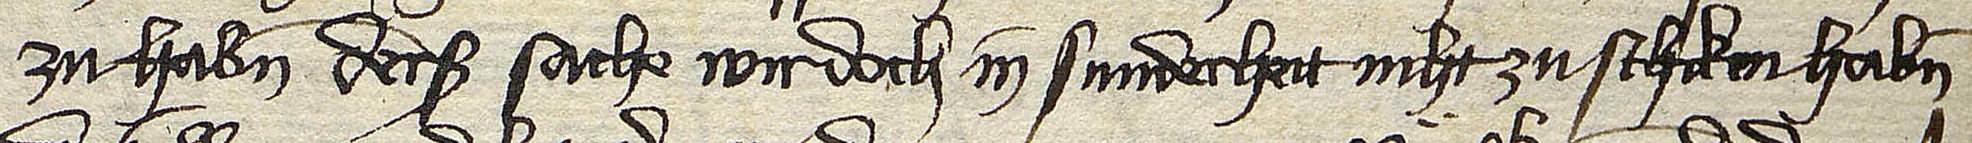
ʒu habn* derſ* ſache wir doch in ſunderheit niht ʒu ſchiken habn*
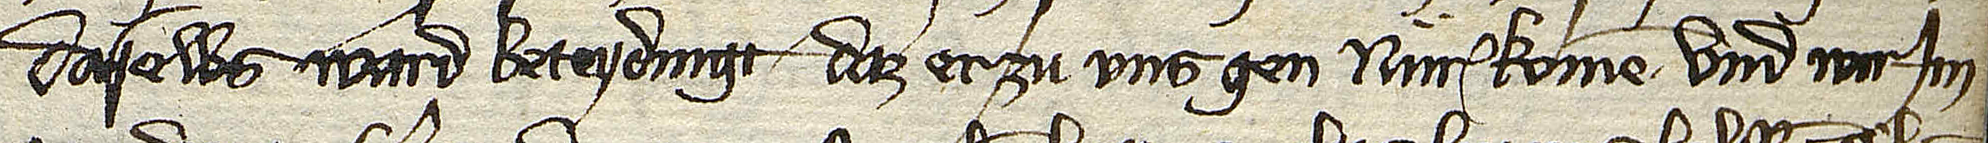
Daſelbs ward beteydingt / daʒ er ʒu vns gen Nür* kome* / vnd wir Im
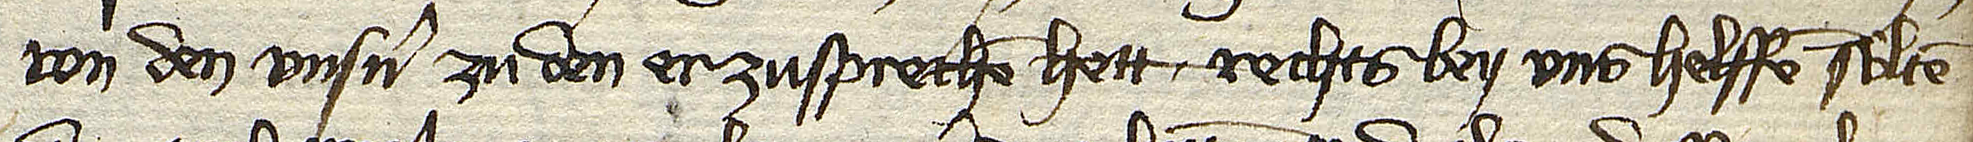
von den vnſn* ʒu den er ʒuſpreche* hett / rechts bey vns helffe* ſölte*
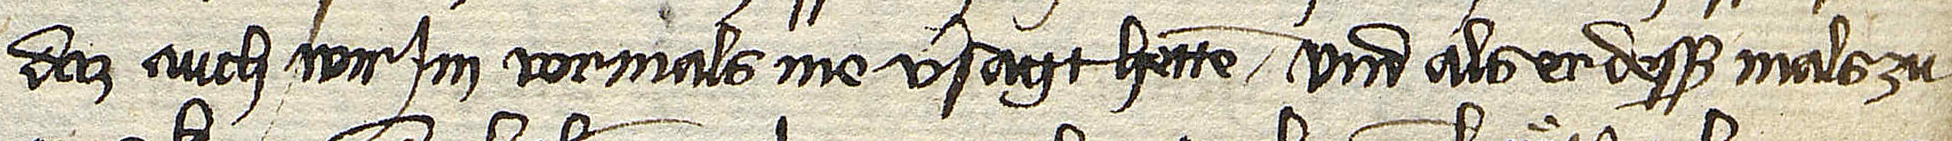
daʒ auch wir Im vormals nie v*ſagt hette* / vnd als er deſſ* mals ʒu
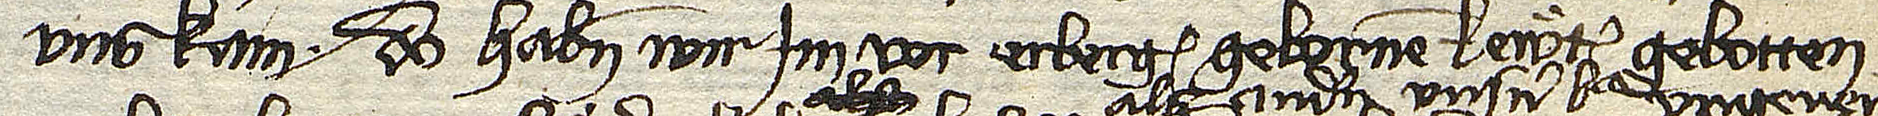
vns kam . Do habn* wir Im vor erberg* geborne* leẅt* gebotten -
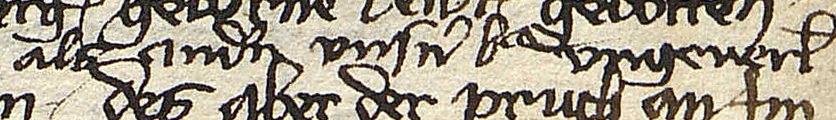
als and*n vnſn* v* vngeuerl*
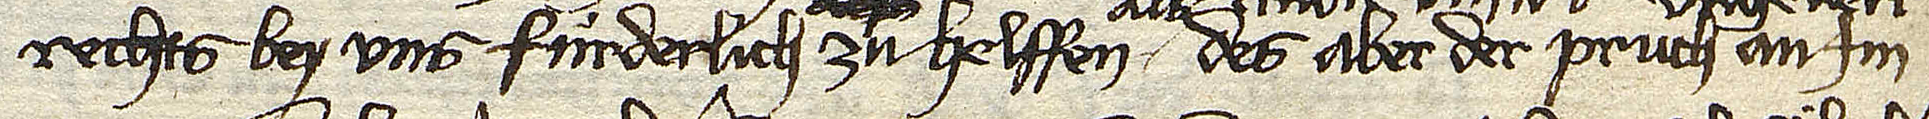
rechts bey vns fürderlich ʒu helffen / Des aber der pruch an Im
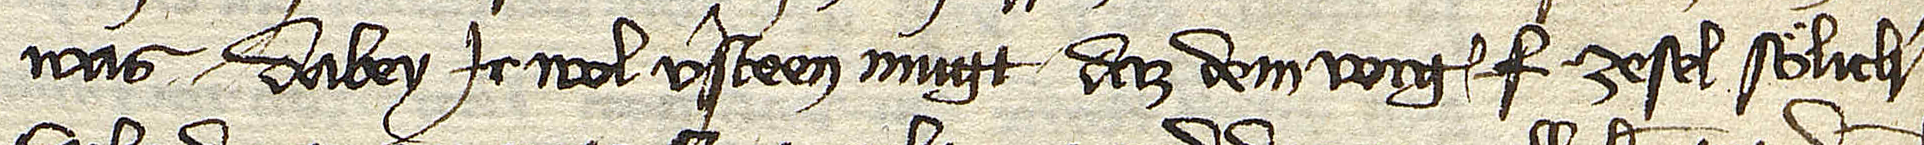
was / Dabey Ir wol v*ſteen mugt / daʒ dem vorg* . F . ʒefel ſölich*
